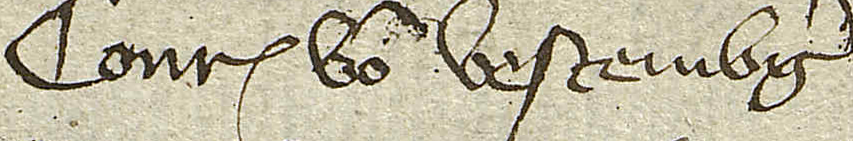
Conr* vo* Veſtembg*
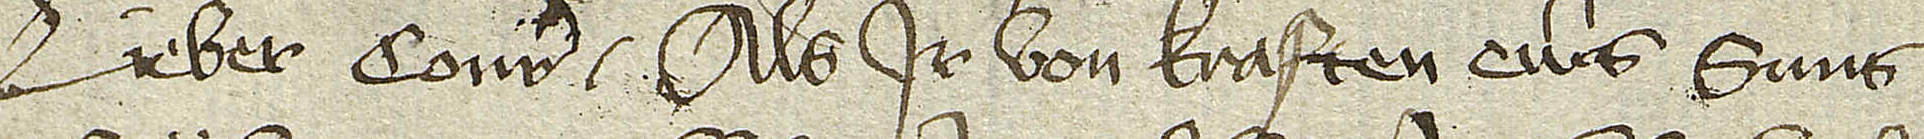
Lieber* Conr* / Als Ir von kraften ews* Suns
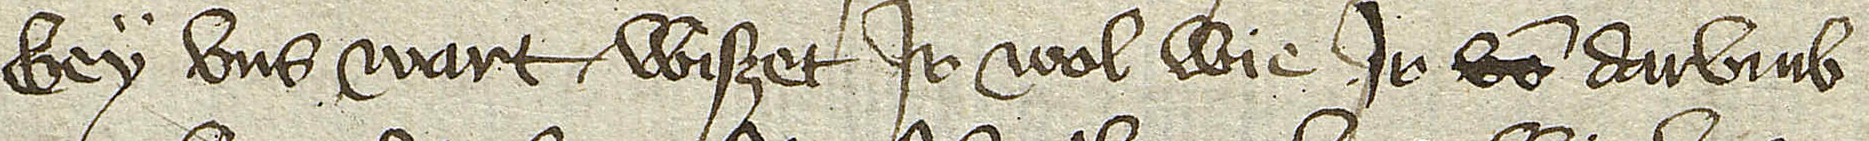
bey vns wart / wiſʒet Ir wol wie Ir vo* darvmb
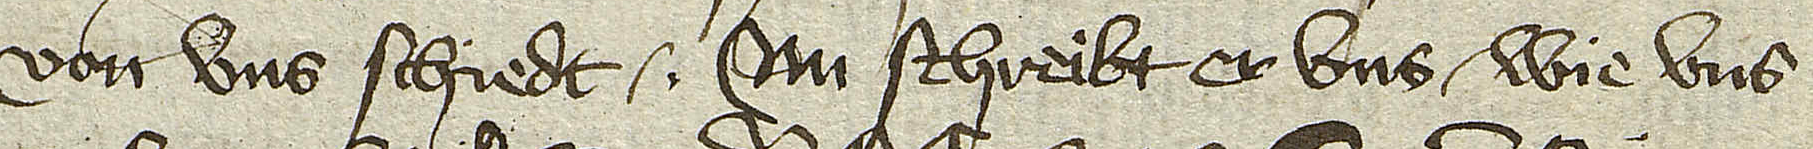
von vns ſchiedt / . Nu ſchreibt er vns / wie vns
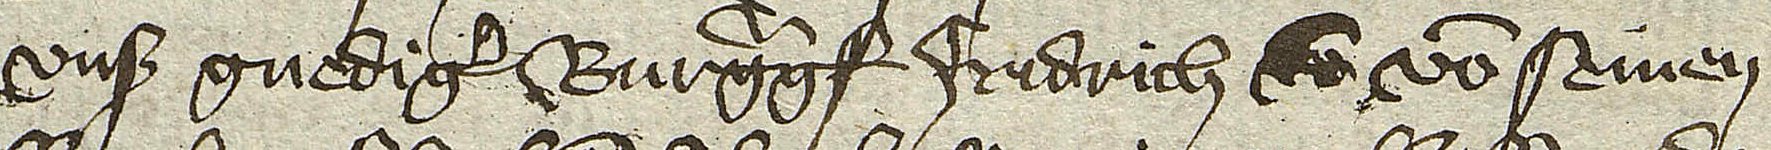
vnſ* gnedig* Burgg*f Fridrich vo vo* ſeinen
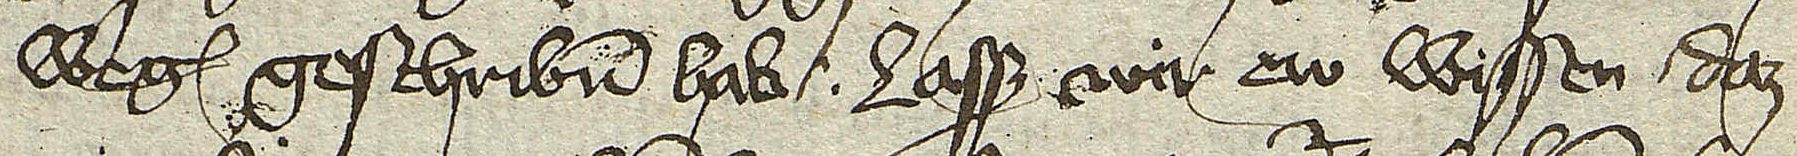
weg* geſchribn* hab / . Laſſ* wir ew wiſſen / daʒ
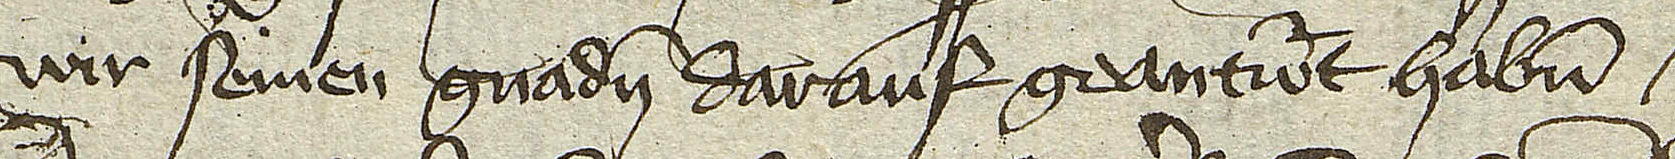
wir ſeinen gnadn* darauf geantwt* habn* /
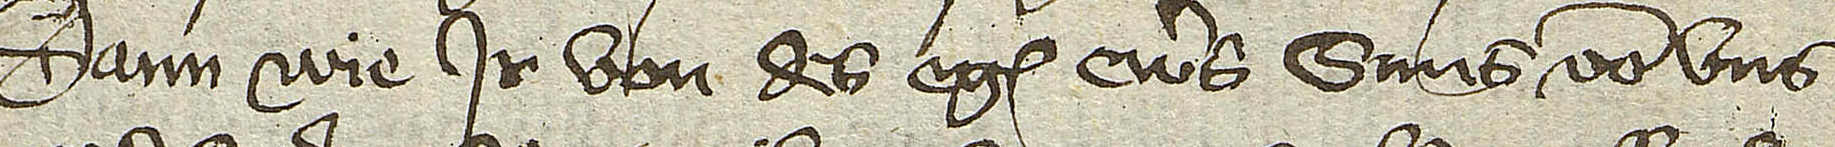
Dan wie Ir von des eg* ew*s Suns vo* vns
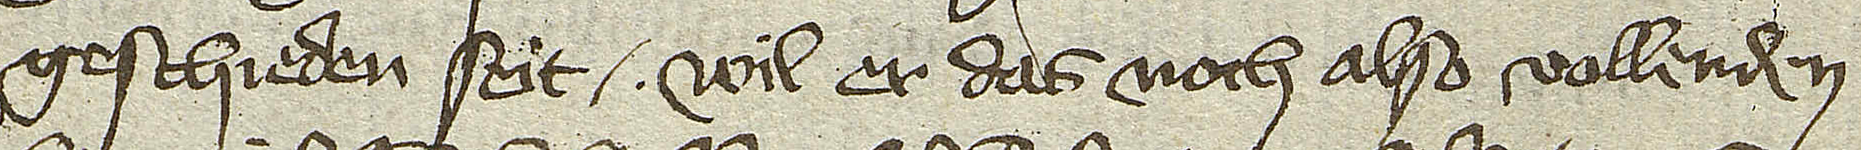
geſchieden ſeit / . wil er das noch alſo vollenden
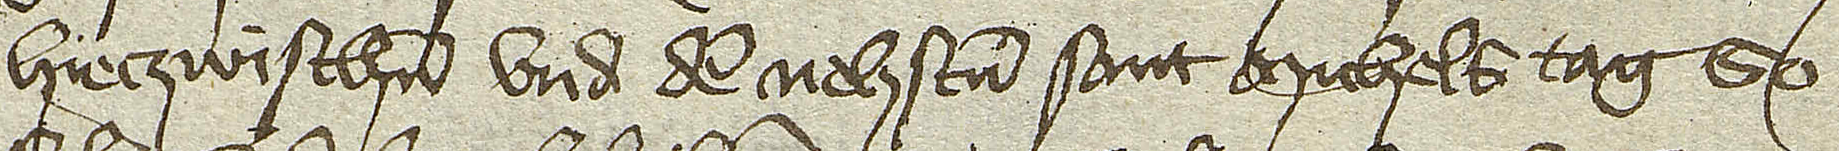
hiecʒwiſchn* vnd d* nehſtn* ſant Michels tag So
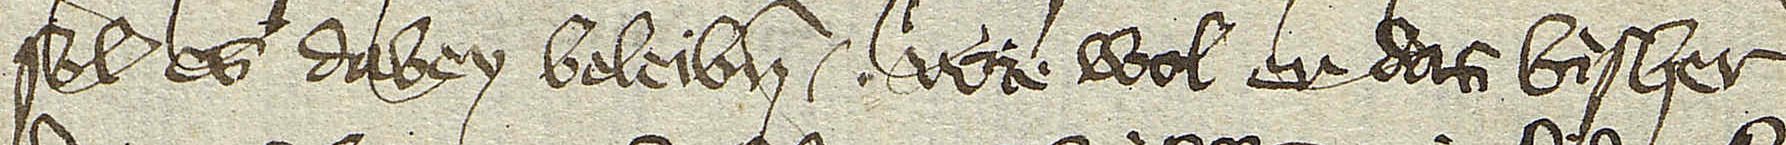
ſol es dabey beleibn* / . wie wol er das biſher
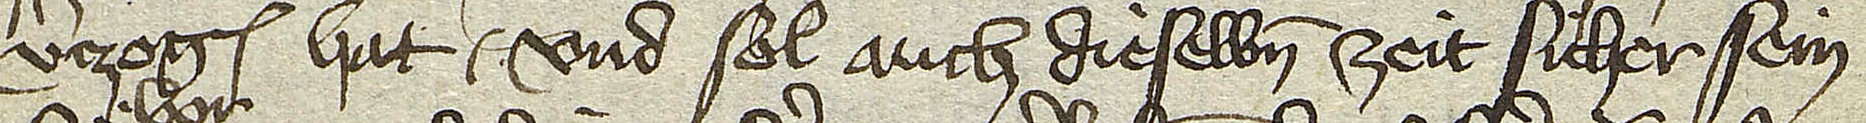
v*cʒog* hat / vnd ſol auch dieſelbn* cʒeit ſicher ſein
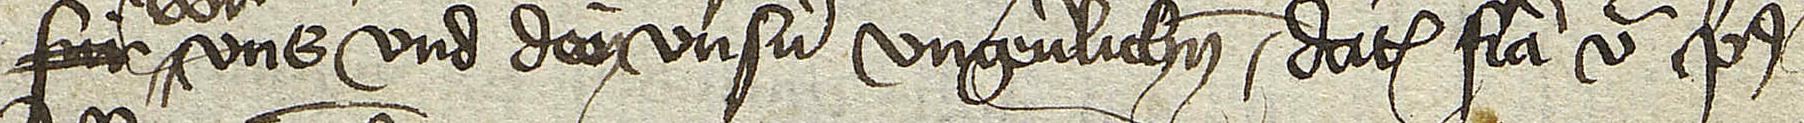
für vns vnd den vnſn* vngeu*lichn* / dat* fia* v* p*
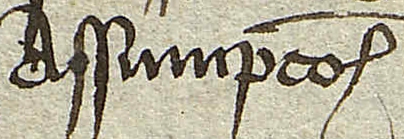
Aſſumpto*
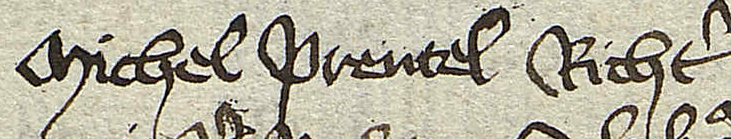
Michel Prentel Richt*
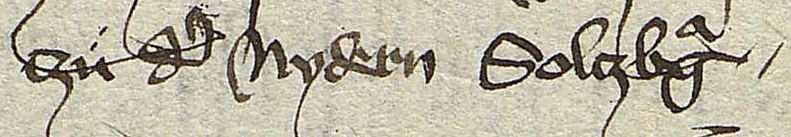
cʒü d* Nydern Solcʒb*g /
